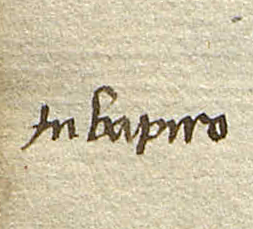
In bapiro
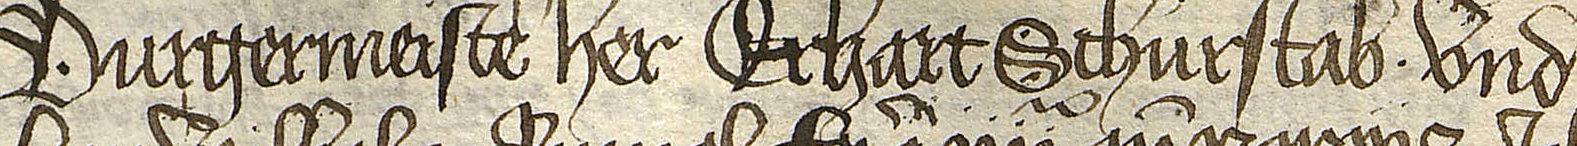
Burgermeiſte* her Erhart Schürſtab . vnd
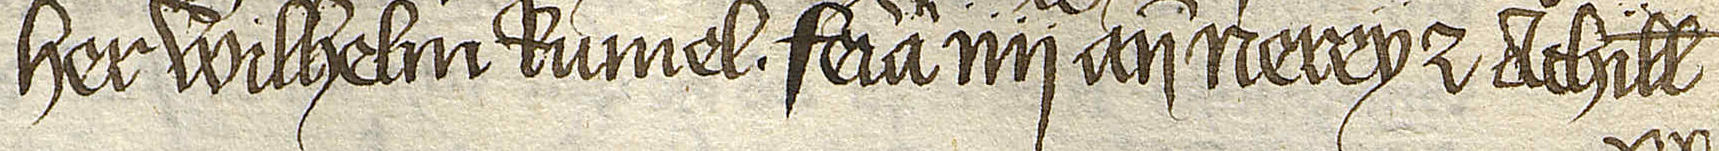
her Wilhelm Rumel . fei*a iiii* an* Nerey @ Achill*
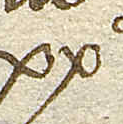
xx*
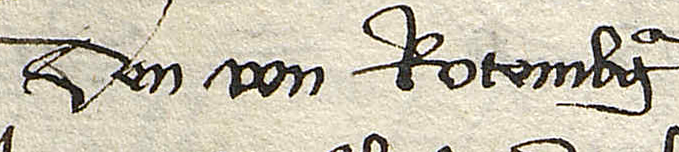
Den von Rotemb*g
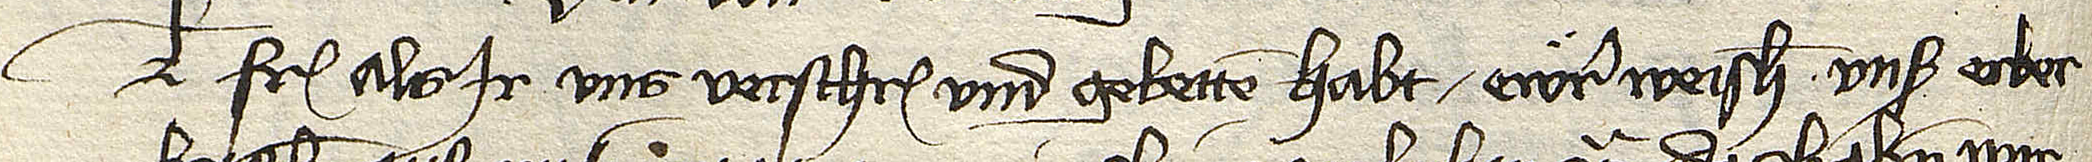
L* fr* als Ir vns verſchr* vnd gebette* habt / eẅr* weiſh* vnſ* erber
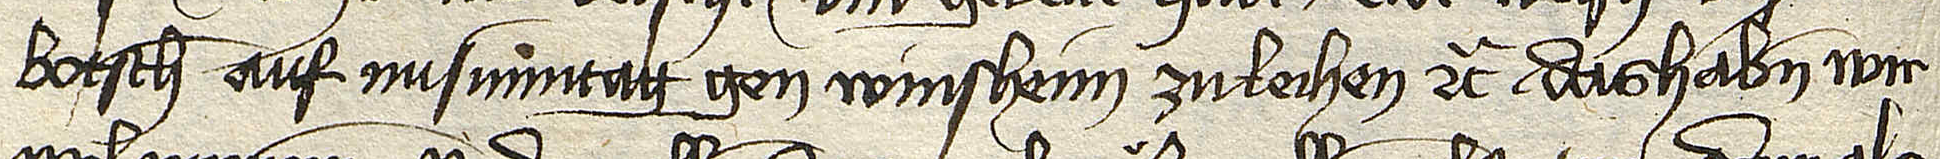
botſch* auf nu ſunntag gen winſheim ʒu leihen ec* / das habn* wir
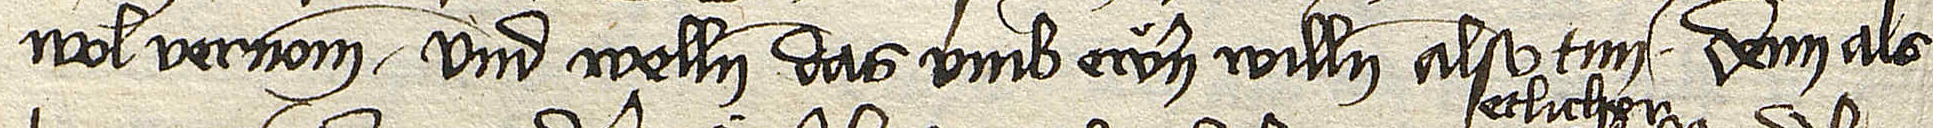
wol vernom* / vnd welln* das vmb eẅ*n willn* alſo tun . Denn als
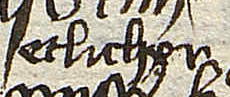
etlicher
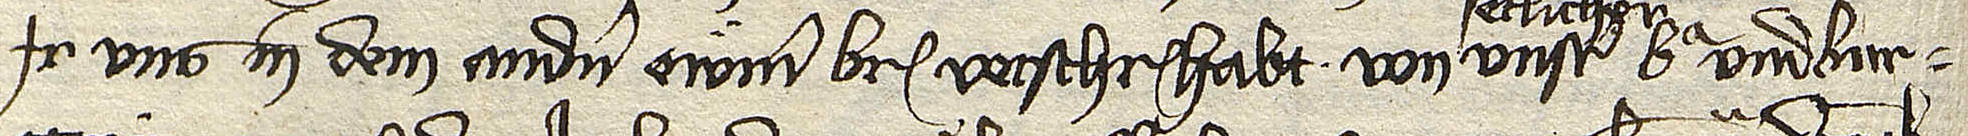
Ir vns in dem andn* eẅ*m br* verſchr* habt . von vnſr* b* vnd bur =
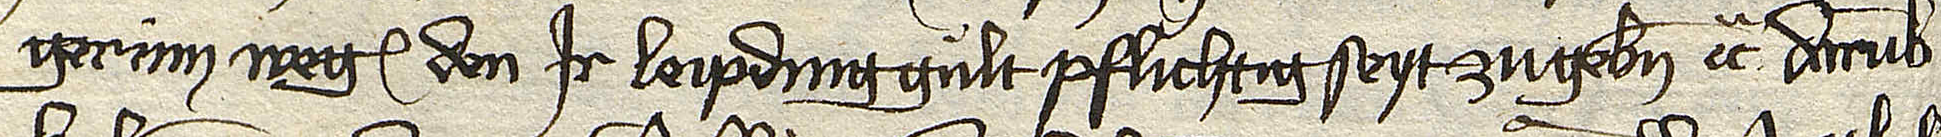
gerinn weg* den Ir leipding gült pflichtig ſeyt ʒu gebn* ec* darub*
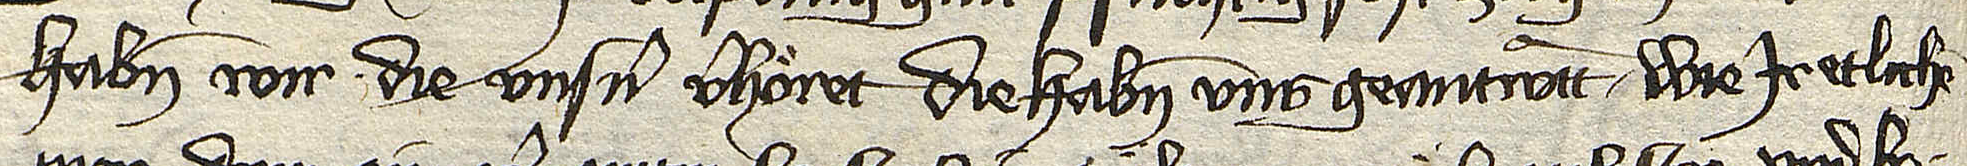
habn* wir . die vnſn* v*höret Die habn* vns geantw*tt / wie Ir etliche*
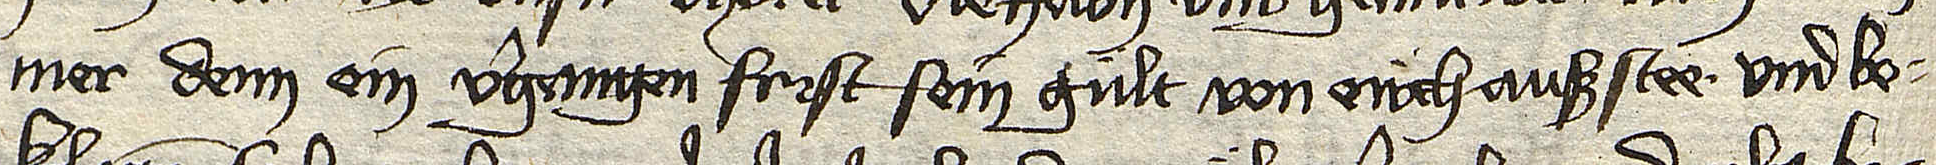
mer denn ein v*gangen friſt ſein gült von eẅch auſʒſtee . vnd be =
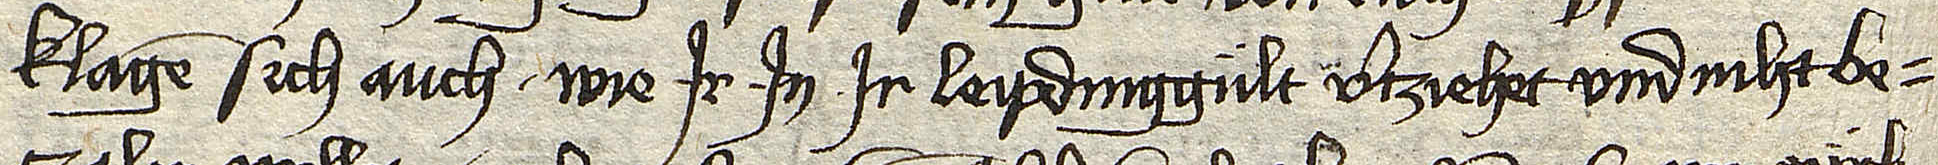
klage* ſich auch / wie Ir In Ir leipdinggült v*cʒiehet vnd niht be =
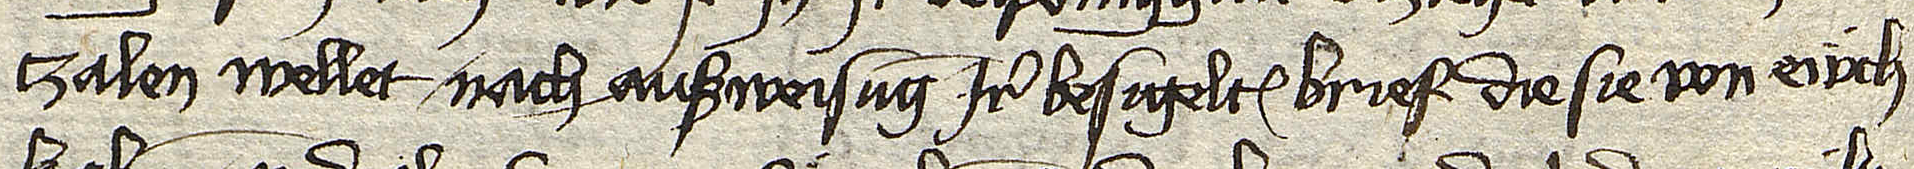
cʒalen wellet / nach auſʒweiſu*g Ir* beſigelt* brief die ſie von eẅch
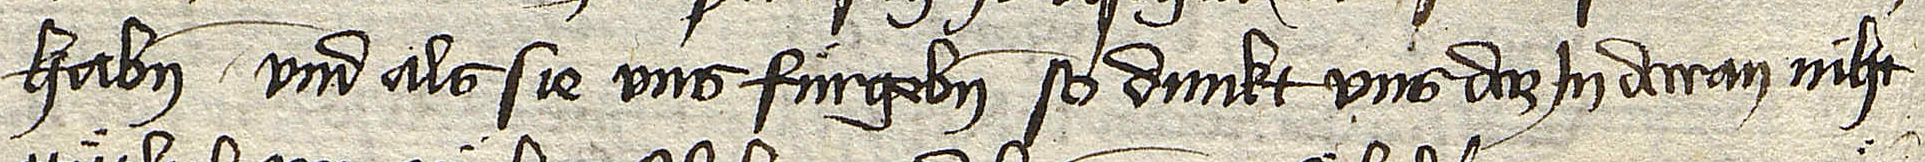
habn* / vnd als ſie vns fürgebn* ſo dunkt vns daʒ In daran niht
